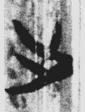之
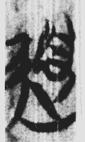道
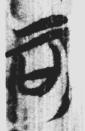可
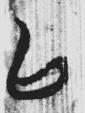㠯（以）
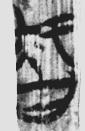智（知）
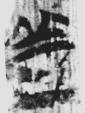善
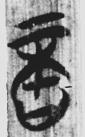否
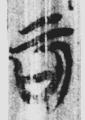可
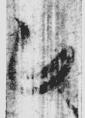㠯（以）
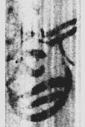智（知）
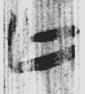亡（無）
